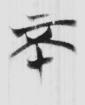不
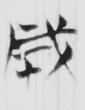成
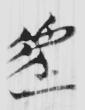𫊟
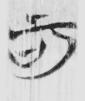可
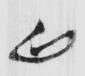㠯（以）
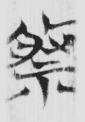祭
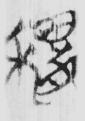稷
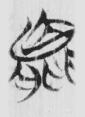{大能}
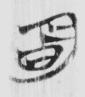明
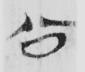公
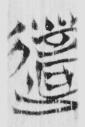{辶丵耳}
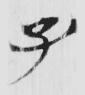子
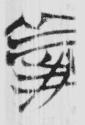義
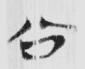公
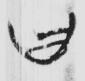曰
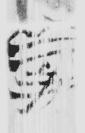義
